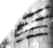馬
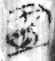○（建）
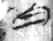於
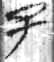子
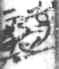○（陷）
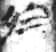於
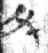丑
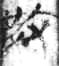○（破）
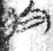於
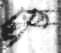寅
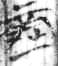坪（平）
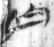於
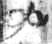卯
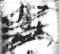寍（寧）
